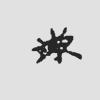東
